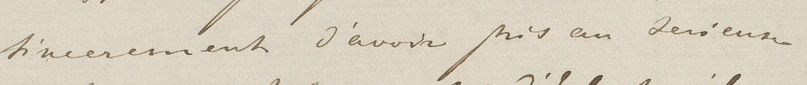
sincerement d'avoir pris au serieux
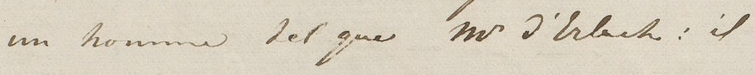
un homme te que Mrd'Erlach: il
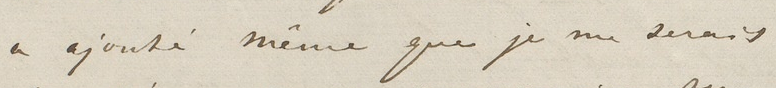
a ajouté même que je me serais
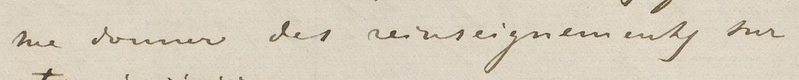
me donner des reinseignements sur
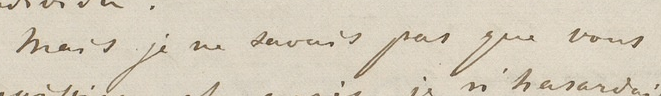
Mais je ne savais pas que vous
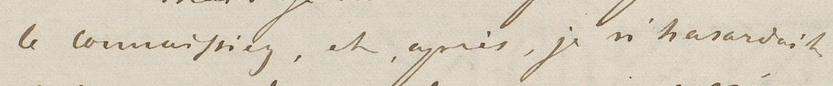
le connaissiez, et, après, je n'hasardait
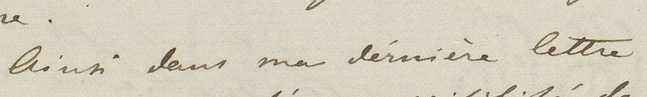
Ainsi dans ma dérnière lettre
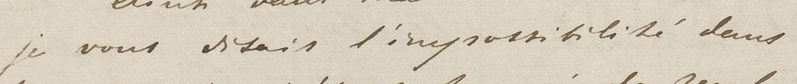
je vous disais l'impossibilité dans
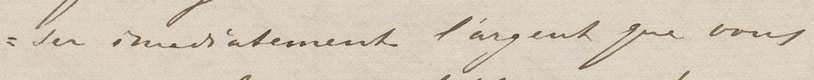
ser imediatement l'argent que vous
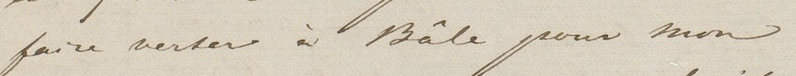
faire verser à Bâle pour mon
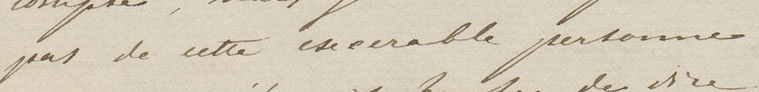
pas de cette excerable personne
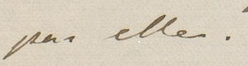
par elle.
